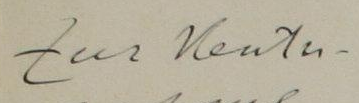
Zur Kentn-
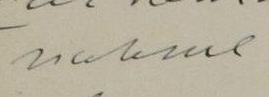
nahme
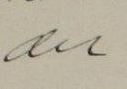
der
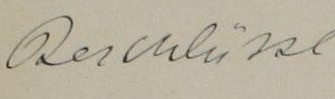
Beschlüsse
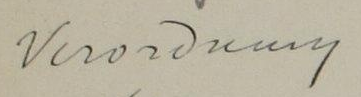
Verordnung
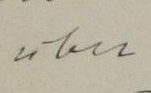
über
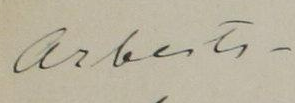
Arbeits-
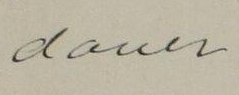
dauer
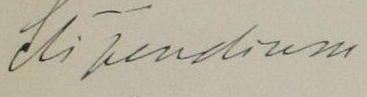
Stipendium
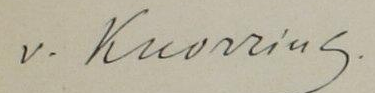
v. Knorring
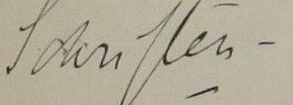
Schriften-
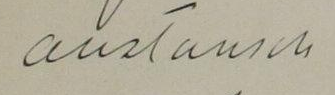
austausch
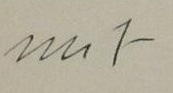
mit
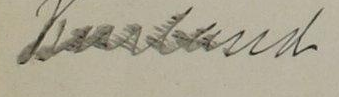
Kurland
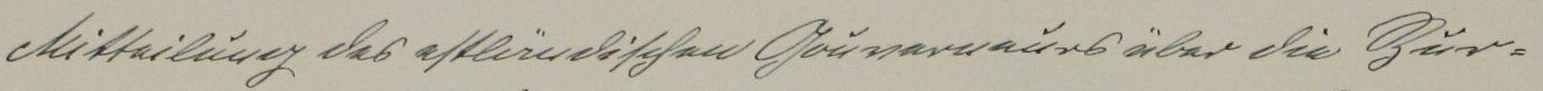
Mitteilung des estländischen Gouverneurs über die Zur-
